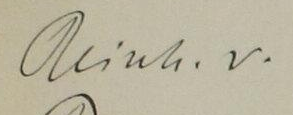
Reinh. v.
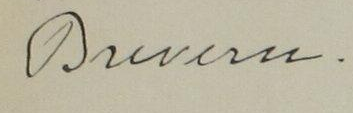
Brevern
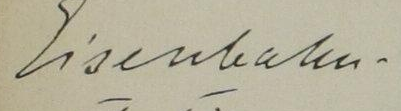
Eisenbahn
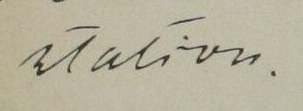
station.
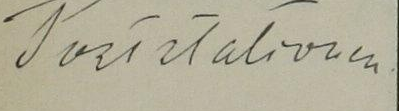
Poststationen
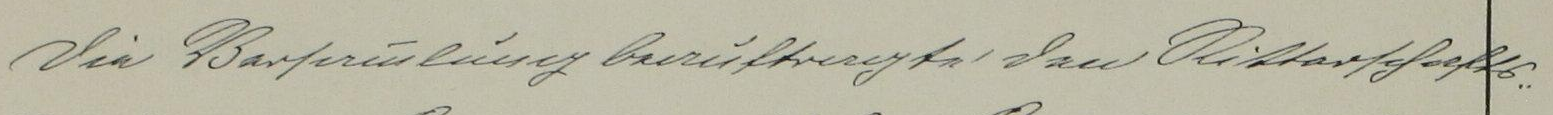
Die Versammlung beauftragte den Ritterschafts-
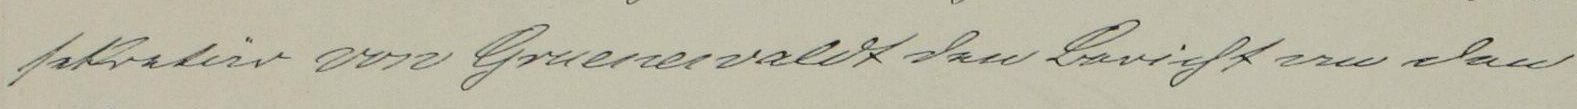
sekretär von Gruenewaldt den Bericht an den
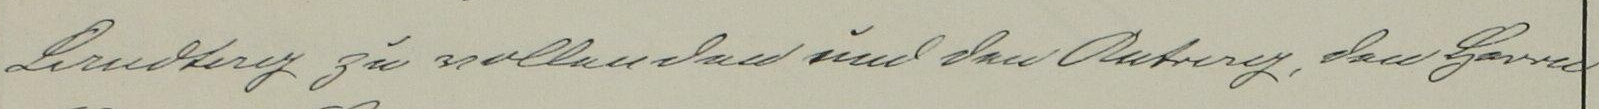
Landtag zu vollenden und den Antrag, den Herrn
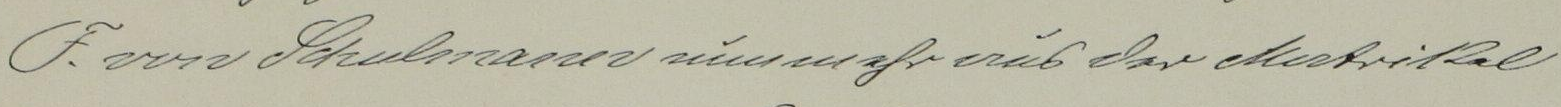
F. von Schulmann nunmehr aus der Matrikel
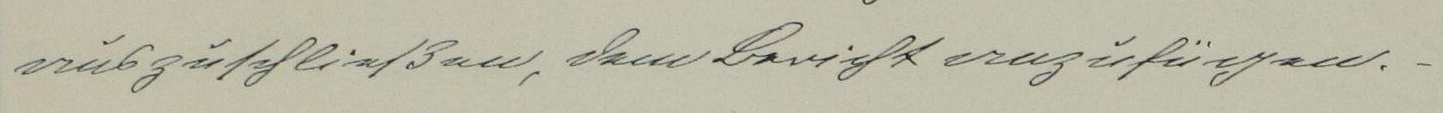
auszuschließen, dem Bericht anzufügen.
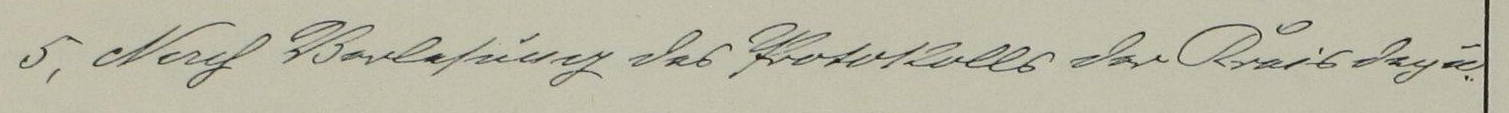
5. Nach Verlesung des Protokolls der Kreisdepu-
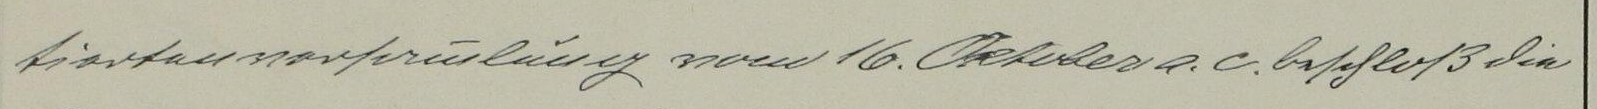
tiertenversammlung vom 16. Oktober a.c. beschloß die
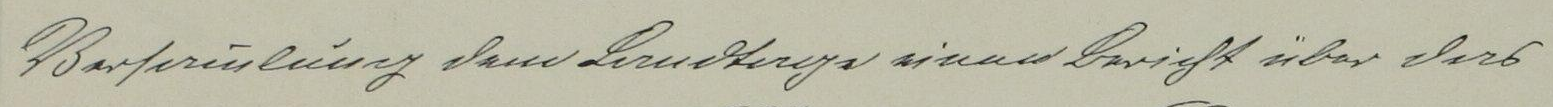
Versammlung dem Landtage einen Bericht über das
